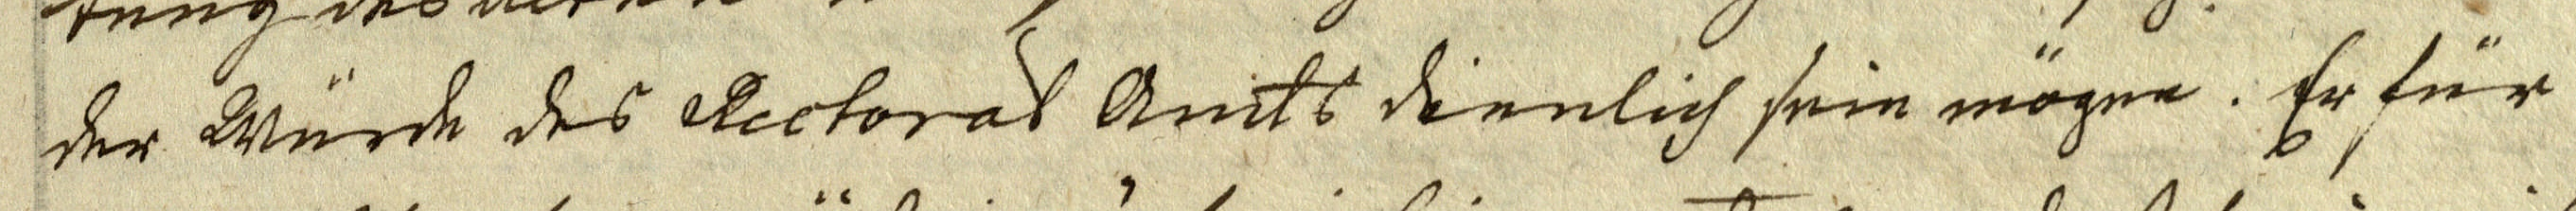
der Würde des Rectorat Amts dienlich sein mögen. Er für
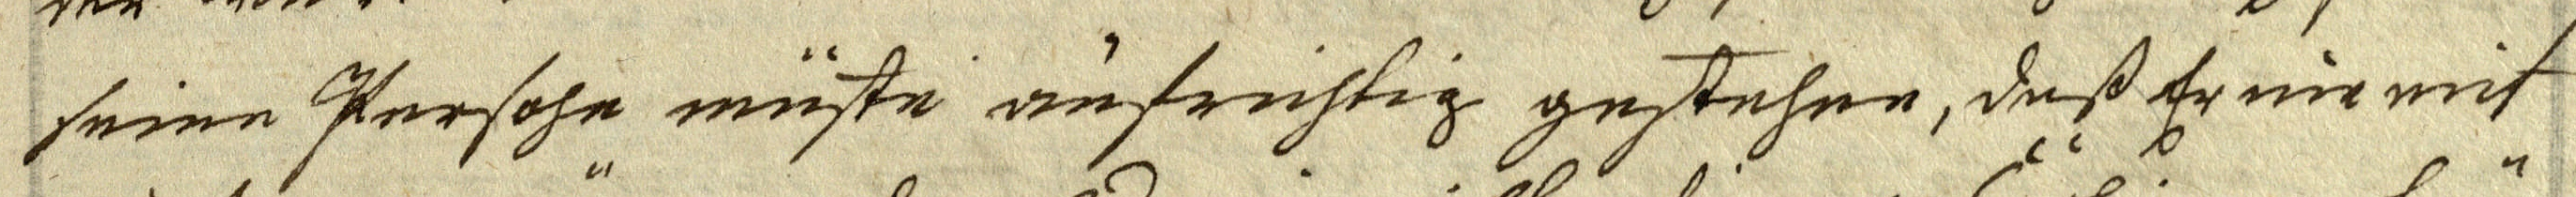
seine Persohn müste aufrichtig gestehen, daß Er nie mit
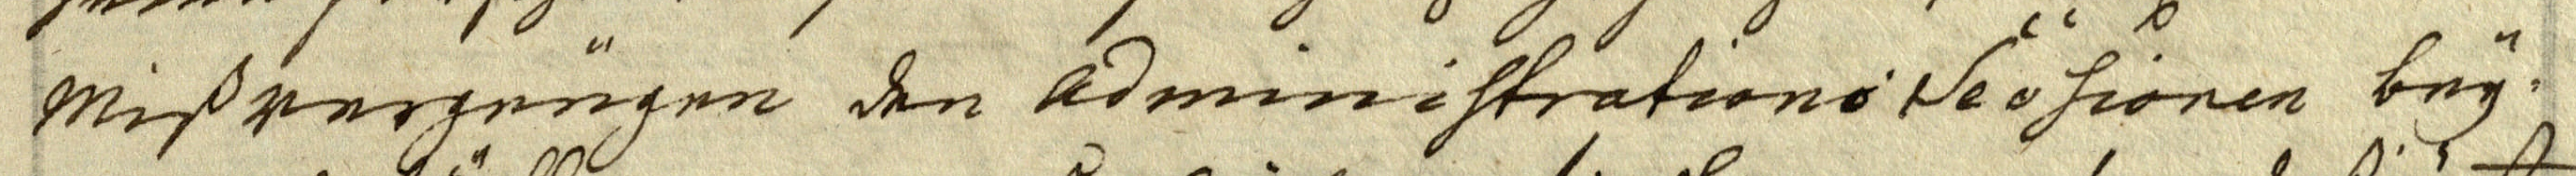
Mißvergnügen den Administrations Sessionen beÿ
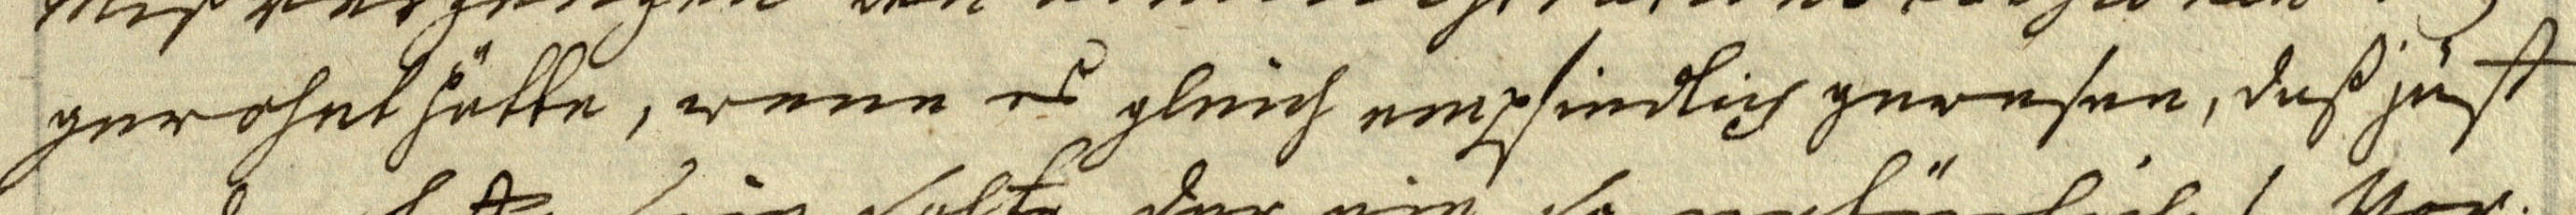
gewohnt hätte, wenn es gleich empfindlich gewesen, daß just
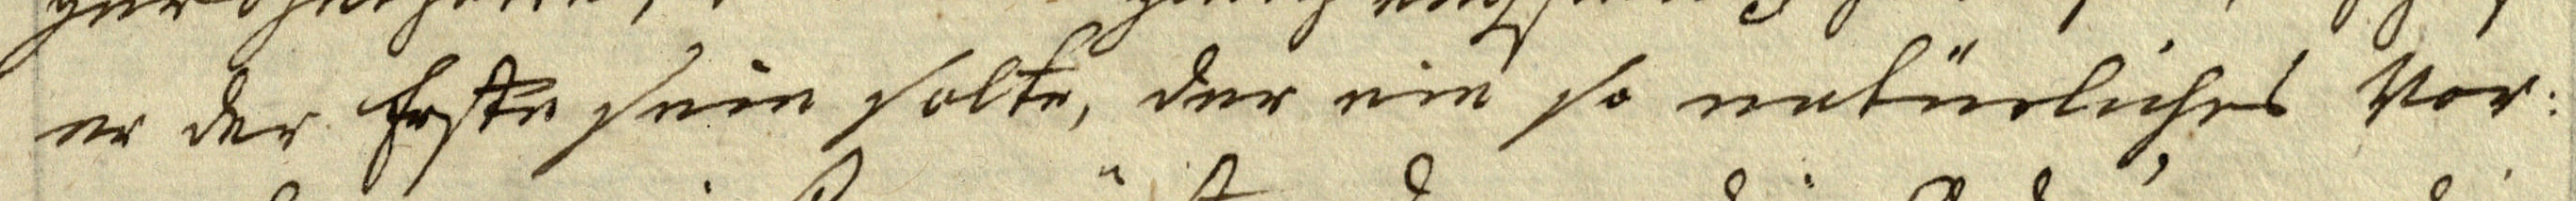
er der Erste sein solte, der ein so natürliches Vor¬
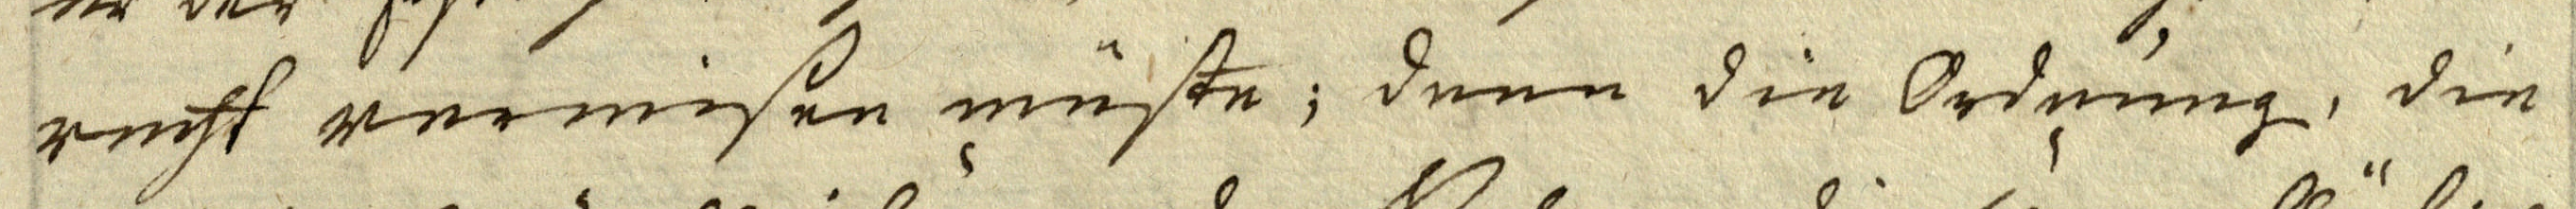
recht vermiesen müste; denn die Ordnung, die
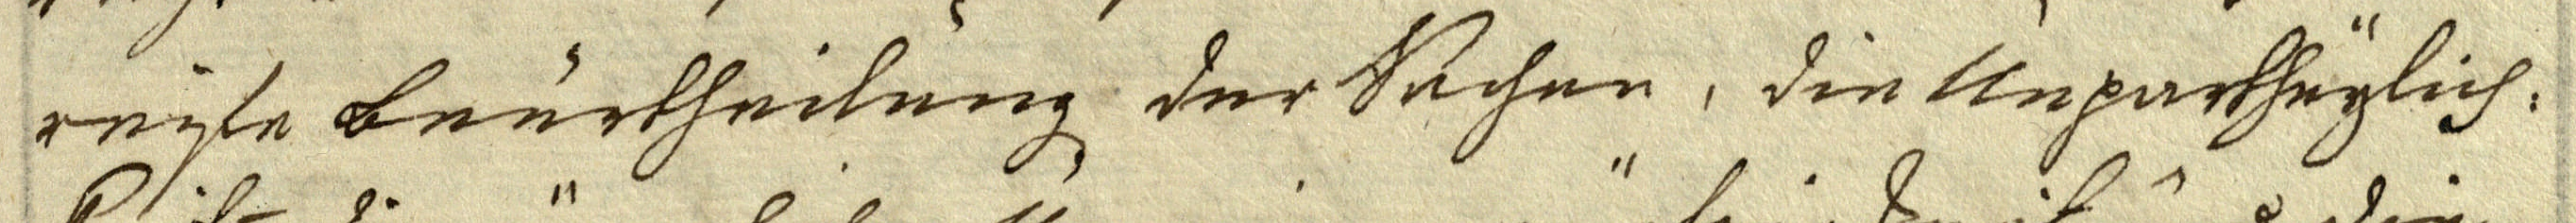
reife Beurtheilung der Sachen, die Unpartheÿlich¬
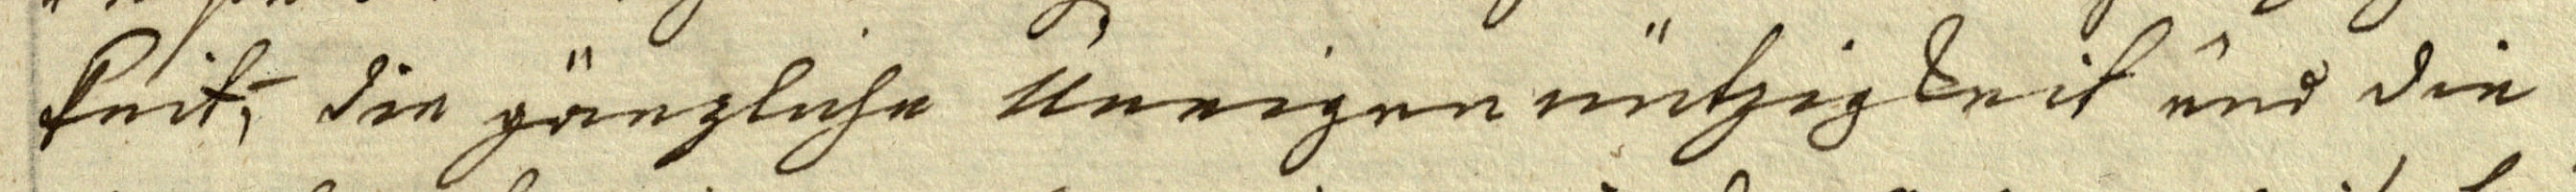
keit die gänzliche Uneigennützigkeit und die
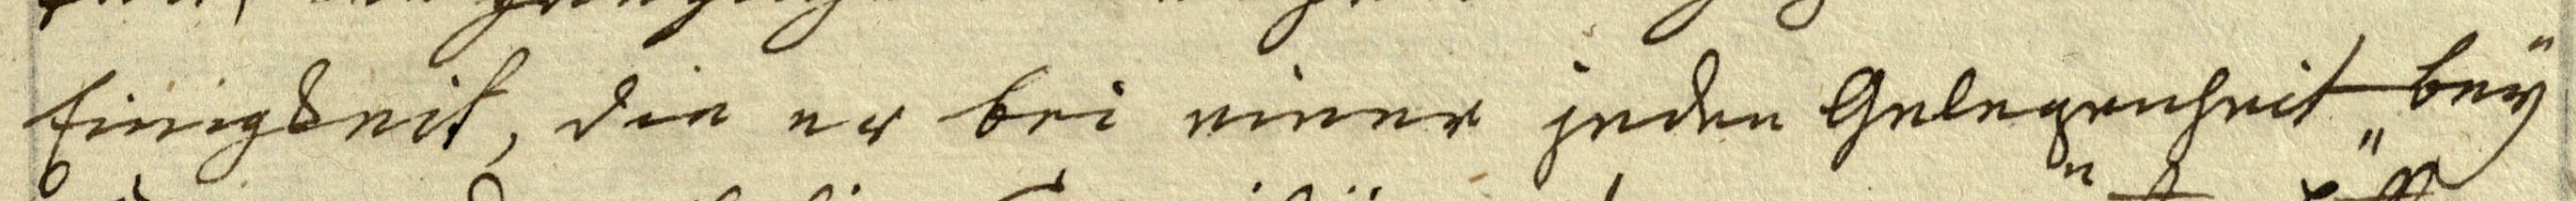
Einigkeit, die er bei einer jeden Gelegenheit beÿ
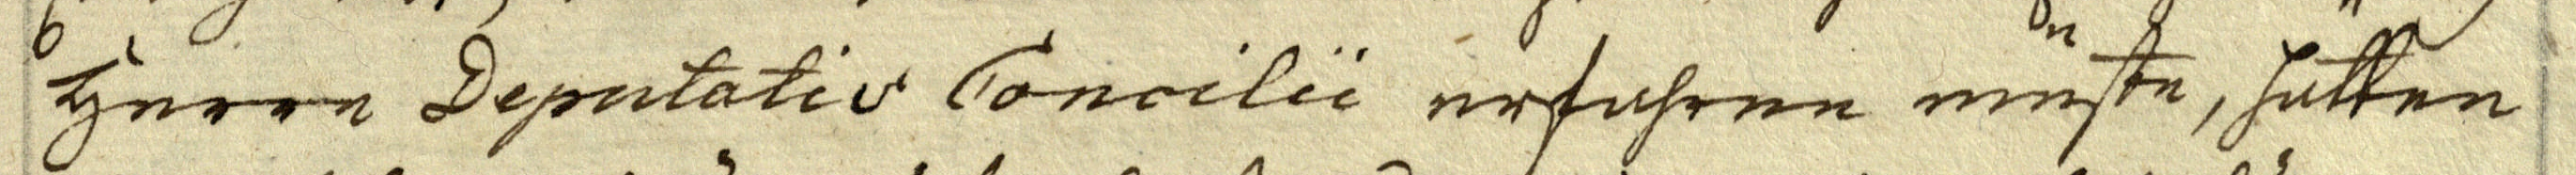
Herrn Deputatis Concilii erfahren muste, hätten
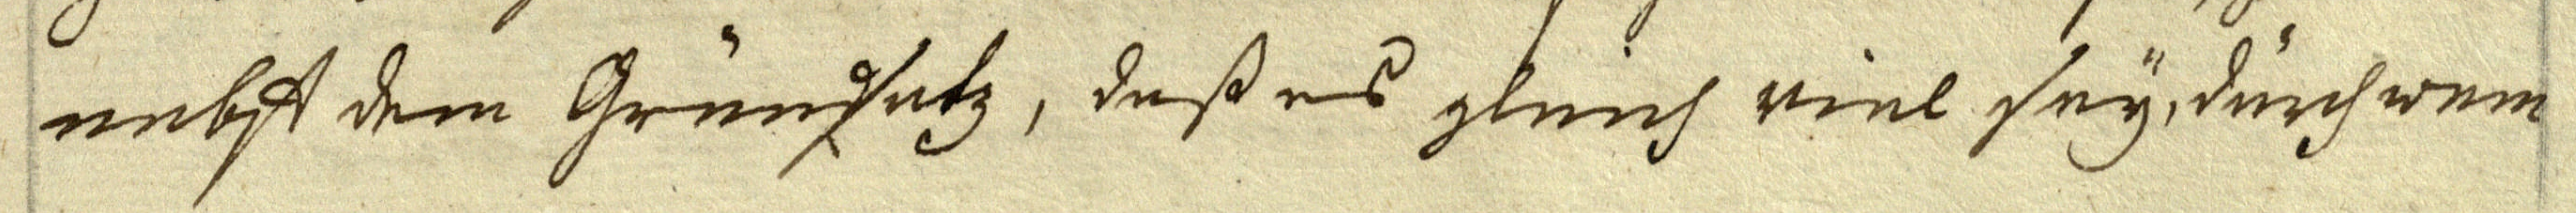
nebst dem Grundsatz, daß es gleich viel seÿ, durch wem
